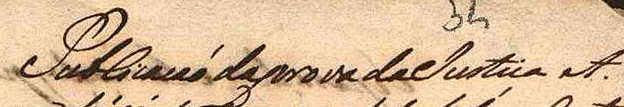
Publicaçaõ da prova da Iustiça A.
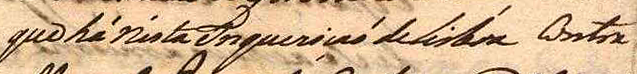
que há nesta Inquiziçaõ de Lisboa Contra
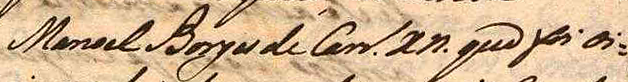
Manoel Borges de Carv.o x n. que foi oi
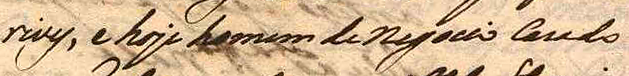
rives, e hoje homem de negocio cazado
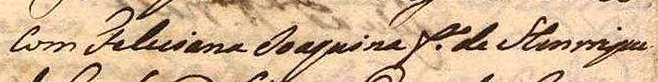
com Feliciana Ioaquina f.a de Henrrique
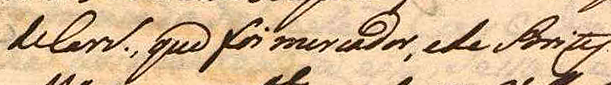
de Carv̄. que foi mercador, e de Brites
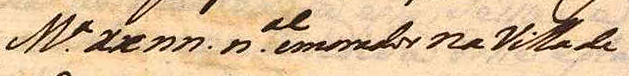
M.a xx nn. n.al e morador na Villa de
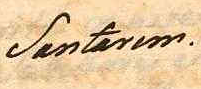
Santarem.
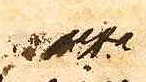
1a tt.a
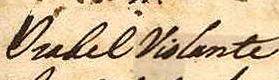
Izabel Violante
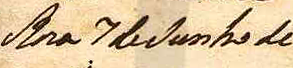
Roza 7 de Iunho de
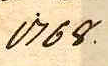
i768.
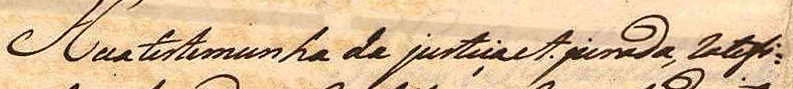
Hua testemunha da justica A. jurada, Ratifi
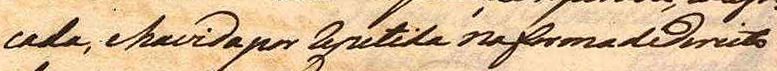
cada, e havida por Repetida na forma de direito
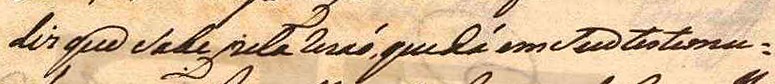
diz que sabe pela Rezaõ, que dá em seu testemu
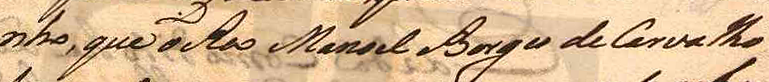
nho, que o Reo Manoel Borges de Carvalho
